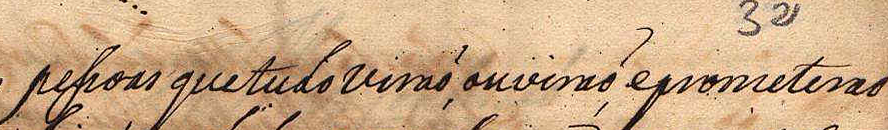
pessoas que tudo viraõ ouviraõ, e prometeraõ
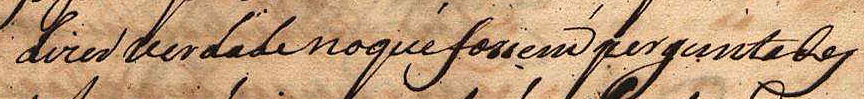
dizer verdade no que fossem perguntados
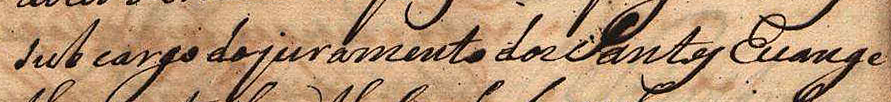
sub cargo do juramento dos Santos Euange
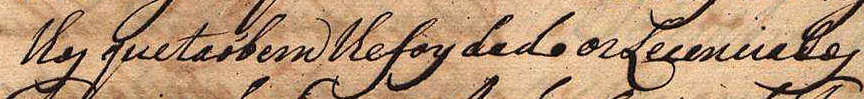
lhos que taõbem lhe foy dado os Lecenciados
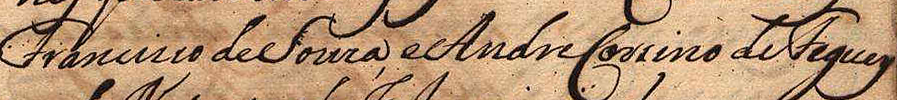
Francisco de Souza, e Andre Corsino de Feguey
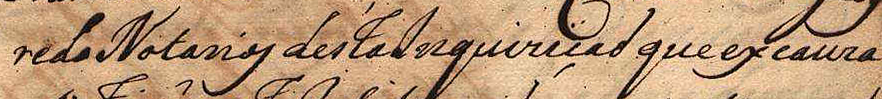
redo Notarios desta Inquiziçaõ que ex cauza
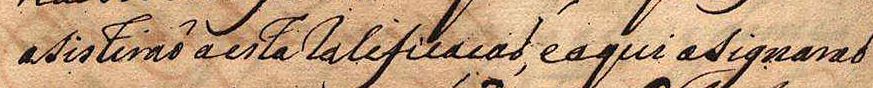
asistiraõ a esta Rateficaçaõ, e aqui asignaraõ
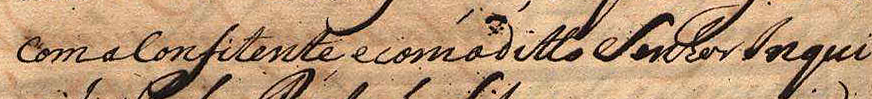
com a confitente, e com o ditto Senhor Inqui
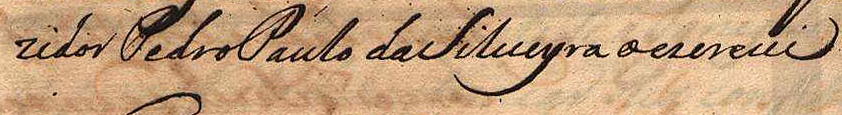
zidor Pedro Paulo da Silueyra o escreui
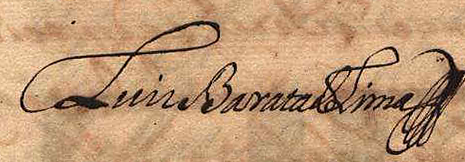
Luiz Barata d̄ Lima
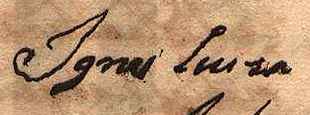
Ignes luiza
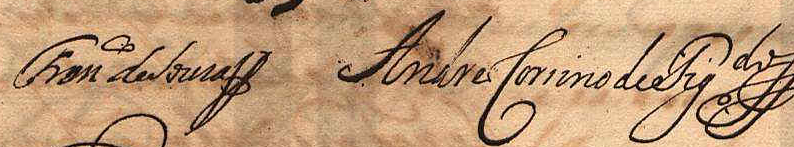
Fran.c de Souza Andre Corsino de Fig.do
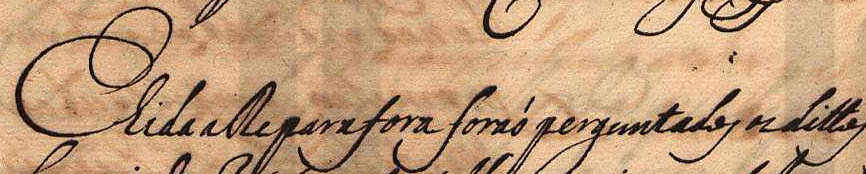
E hida a Re para fora foraõ perguntados os dittos
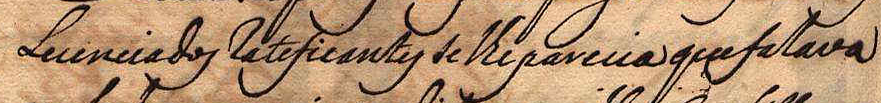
Lecenciados Rateficantes se lhe parecia que falava
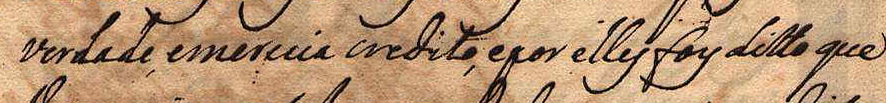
verdade, e merecia credito, e por elles foy ditto que
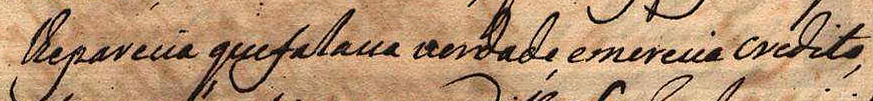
lhe parecia que falaua verdade, e merecia credito,
